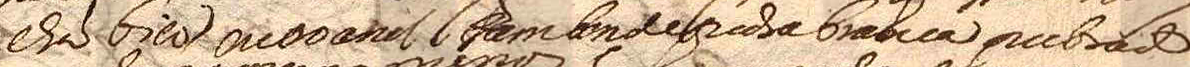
e hū bico outro anel tambem de pedra branca quebrado
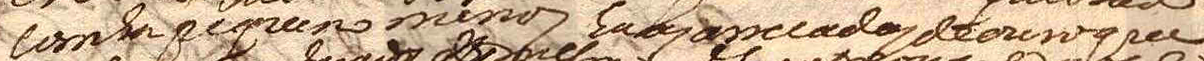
com ho pequeno menos huas arrecadas de ouro que
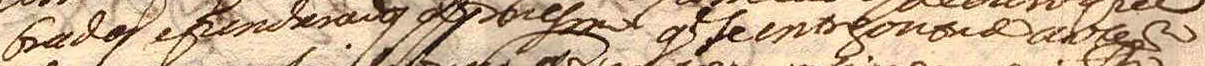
brados e pendurados do mesmo q̄ se entregou tudo ao tezro
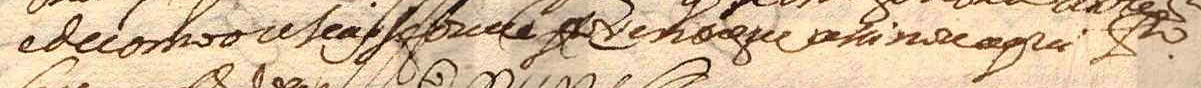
e de como o alcaj se ouue por entregue assinou aqui P.ro
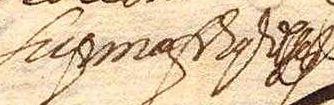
Lupina fre q̄ o escj
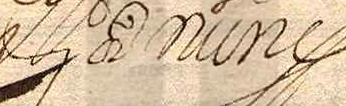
Agosto Nunes
